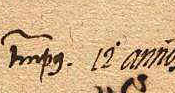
tēnpꝯ. 12 annos
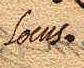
Locus.
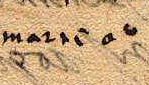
maria ao
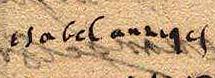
isabel anriqes
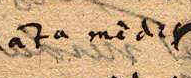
ata mēdez
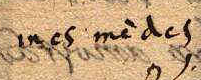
ines mēdes
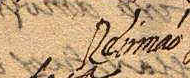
Ré irmaõ
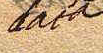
da ta
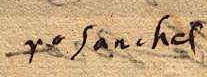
ro Sanches
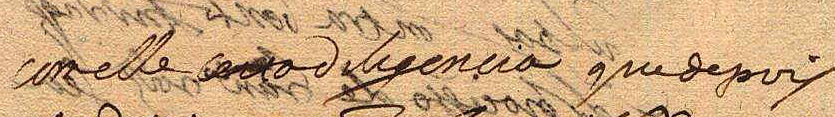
com elle certa diligencia que depois
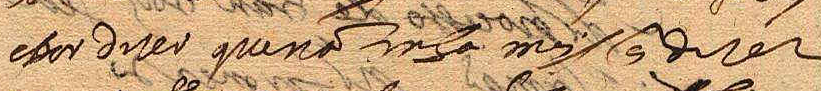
e por dizer que naõ tinha majs q̄ dizer
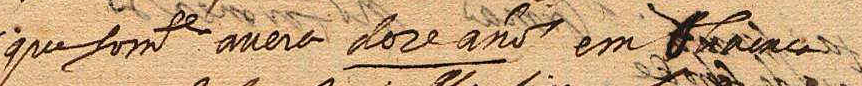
que somte auera doze an̄os em Oliuença
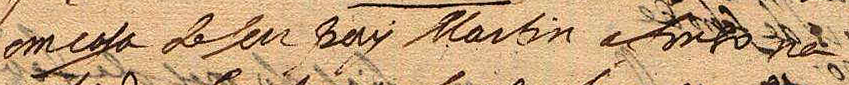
em casa de seu pay Martin afonso na
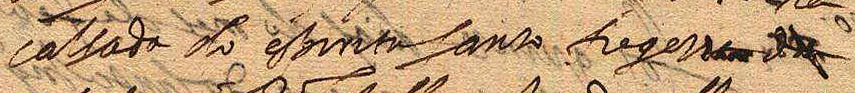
calsada do espirito santo fregezia da
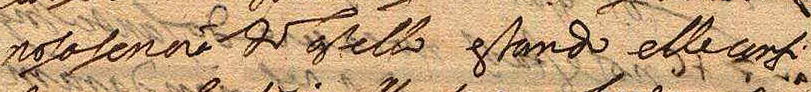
nosa senor̄a do castello estando elle confi
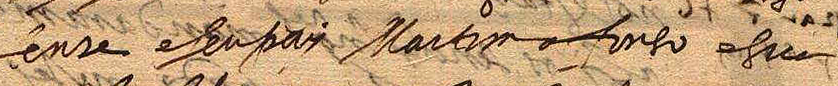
tente e seu pay Martim afonso e sua
